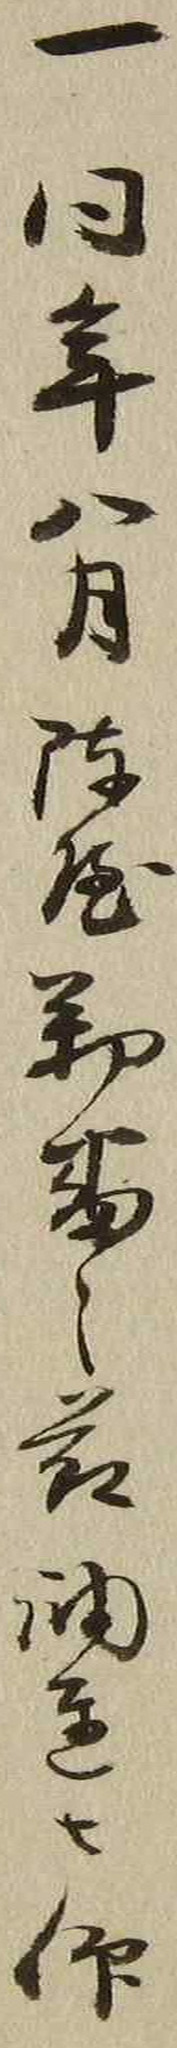一同年八月陣屋勤番之節調達被仰
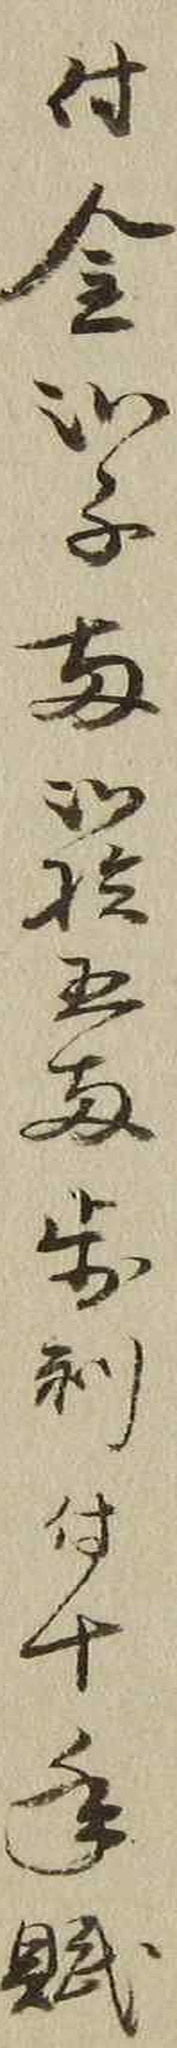付金弐千両弐拾五両歩利付十年賦
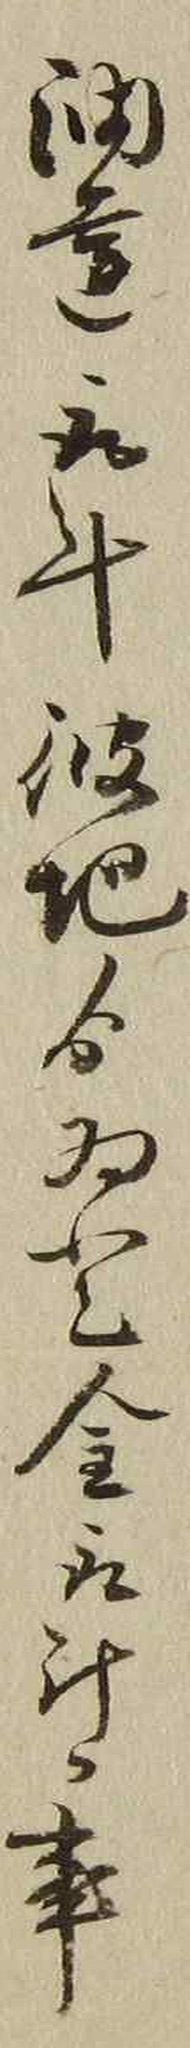調達取計彼地ゟ為登金取計候事
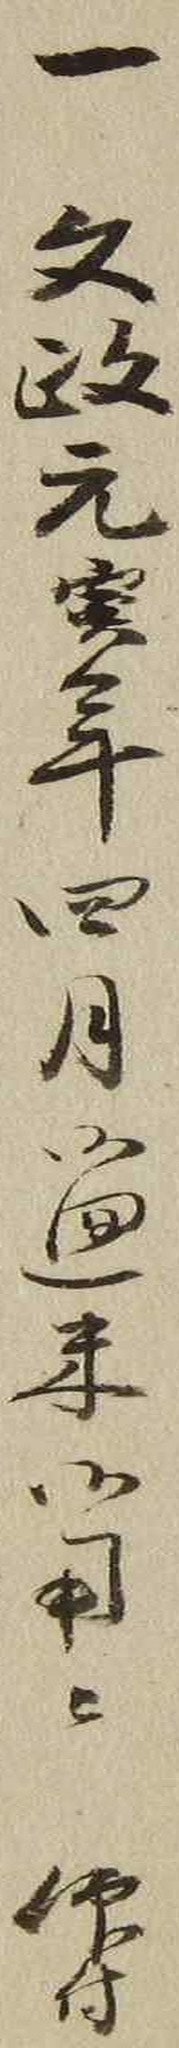一文政元寅年四月御廻米御用被仰付
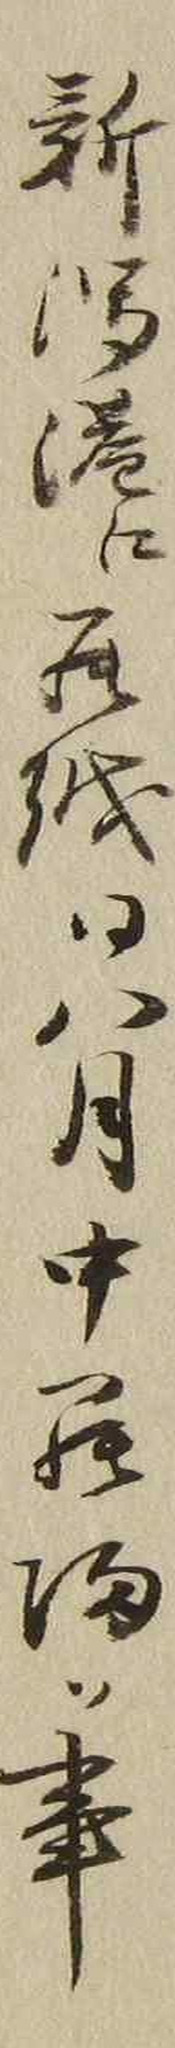新潟港江罷越同八月中罷帰候事
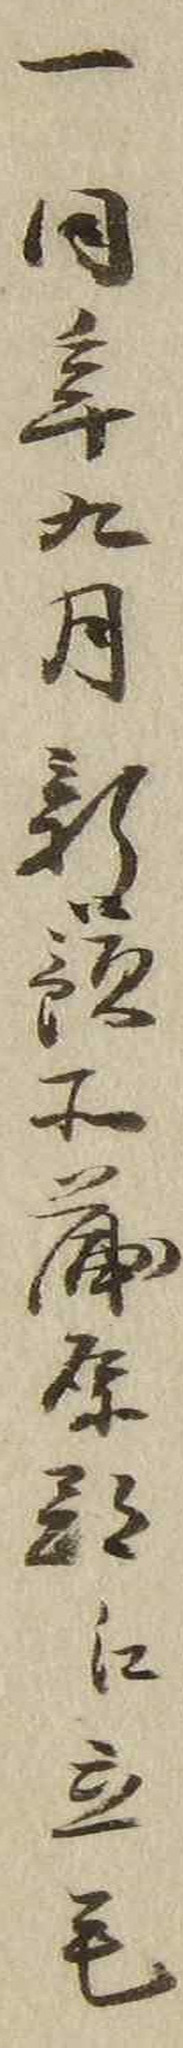一同年九月新御預所蒲原郡江立毛
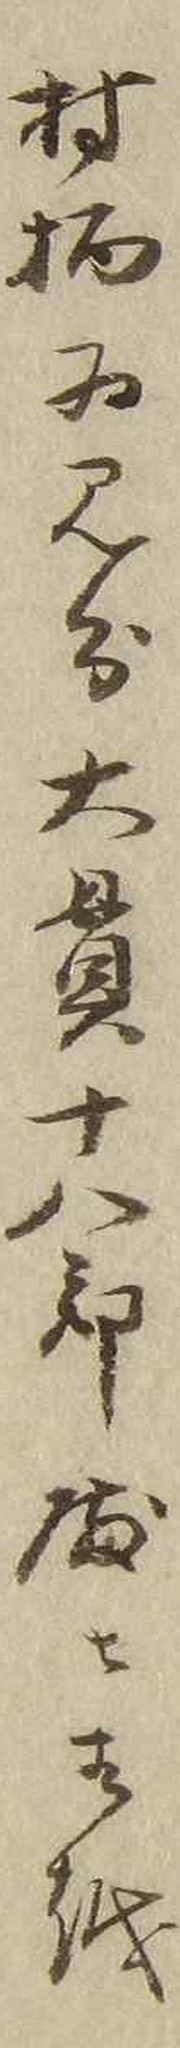村柄為見分大貫十八郎殿被相越

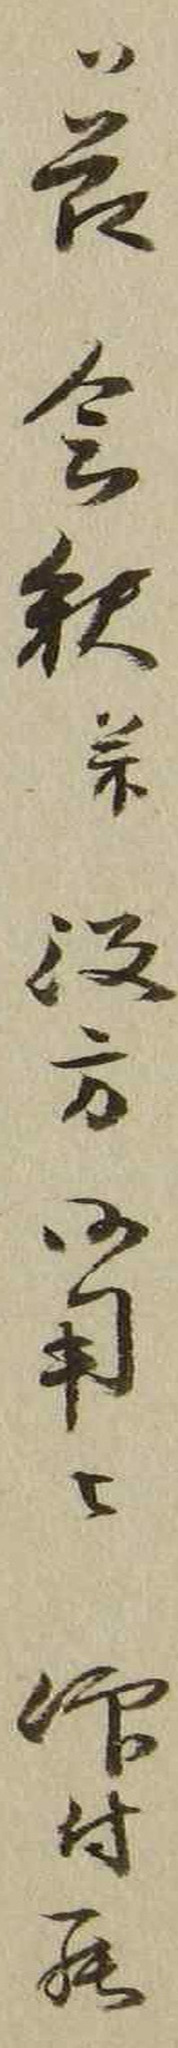候節会釈并役方御用被仰付罷
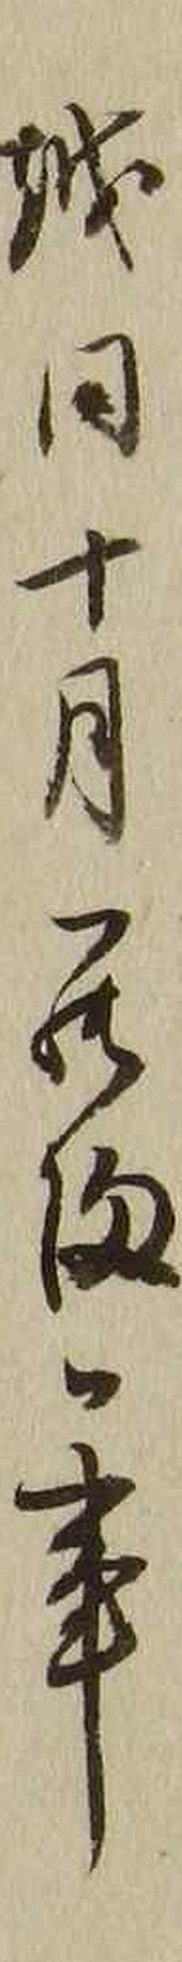越同十月罷帰候事
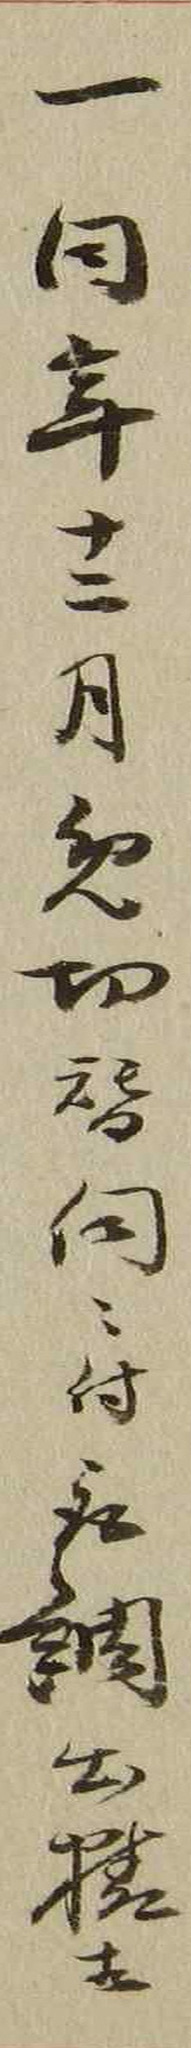一同年十二月免切替伺ニ付取調出精相
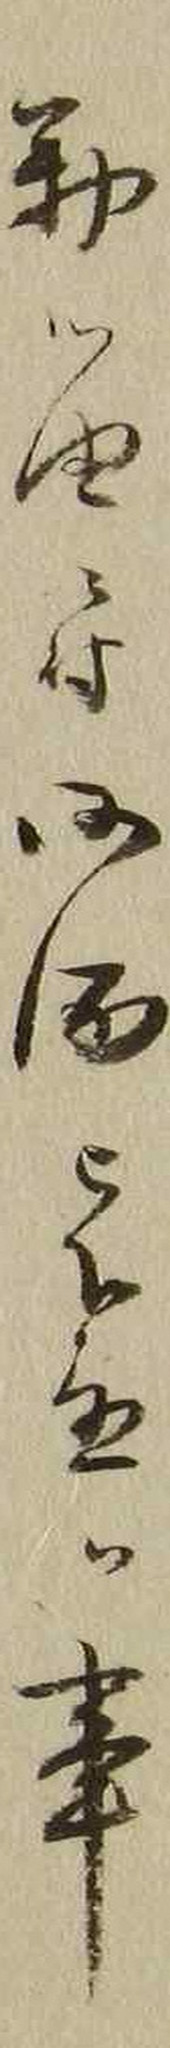勤候由ニ付御酒被下置候事
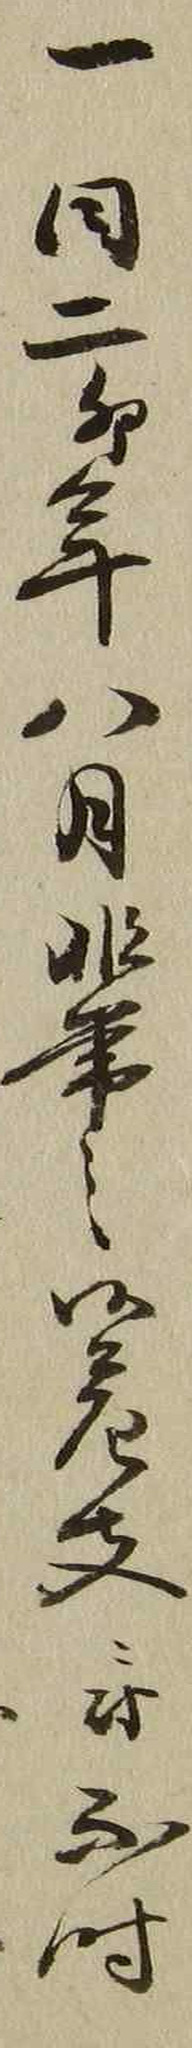一同二卯年八月非常之御差支ニ付不時
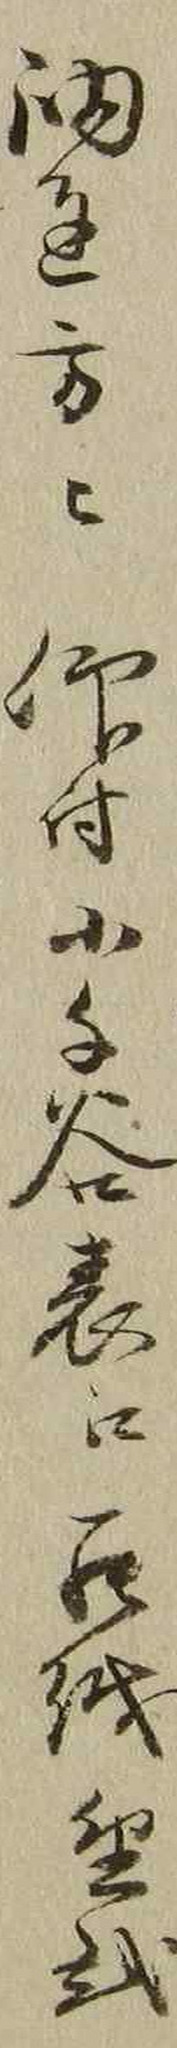調達方被仰付小千谷表江罷越金弐
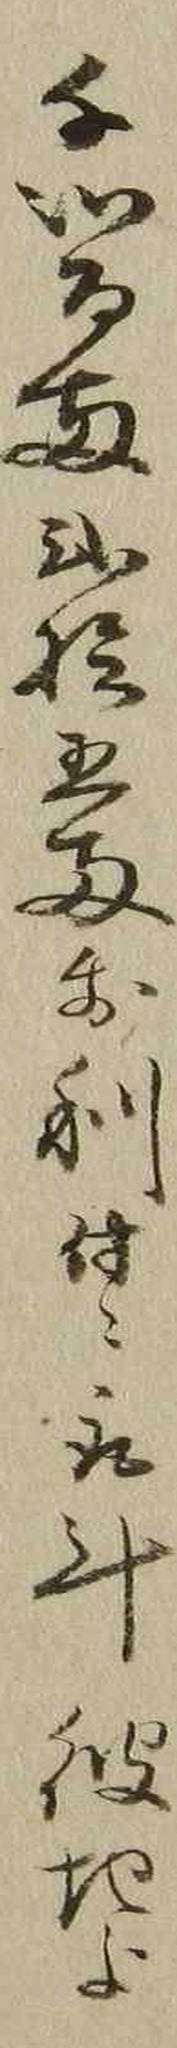千弐百両弐拾五両歩利付ニ取計彼地よ
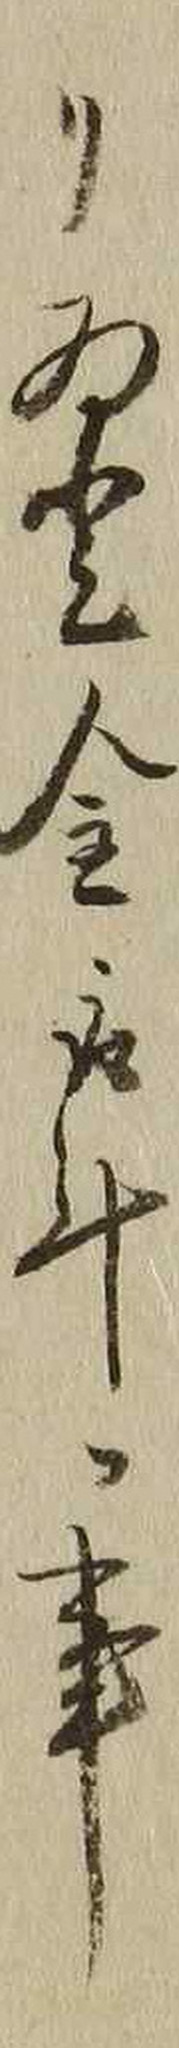り為登金取計候事
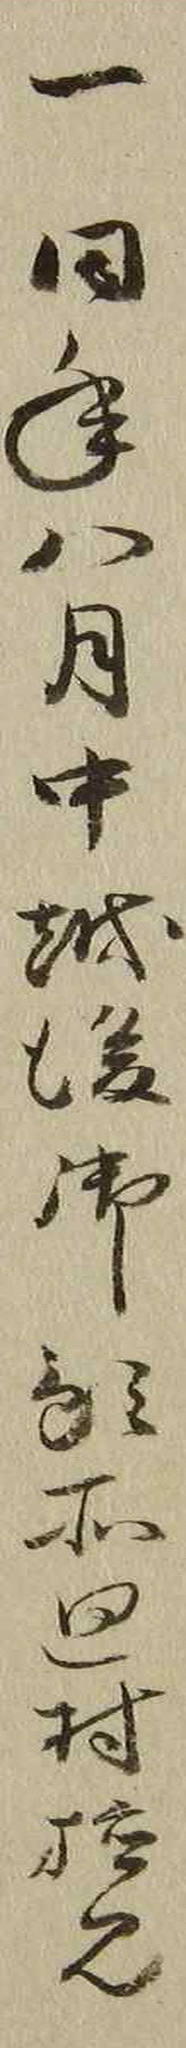一同年八月中越後御預所廻村検見
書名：諸士系譜　巻之236　ふ之部4
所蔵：会津若松市立会津図書館
